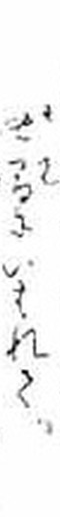世間にいはれて
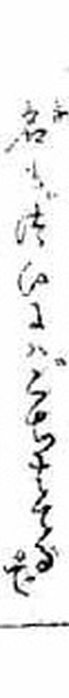名もつひにはくちはてるので
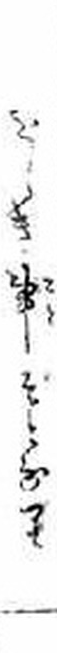をしき事ぞとなり

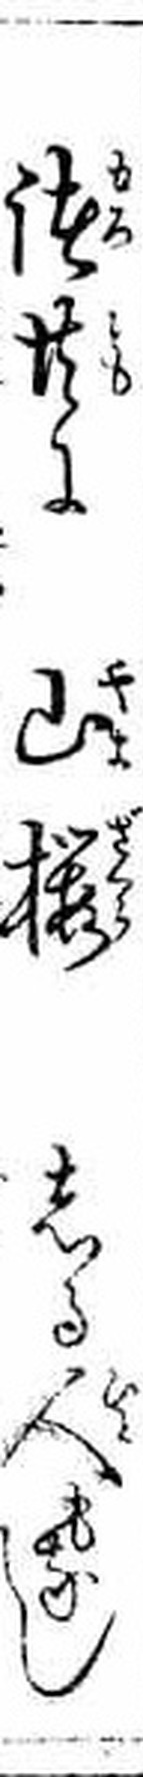諸共に山櫻しる人もなし
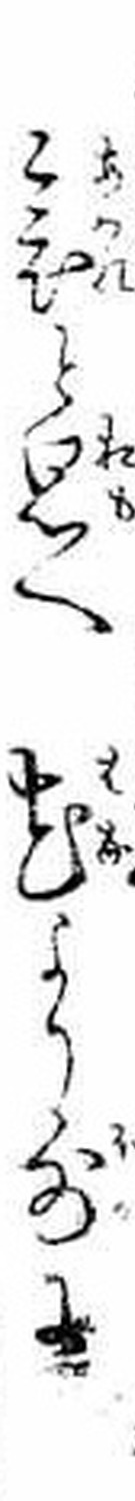哀と思へ花より外に
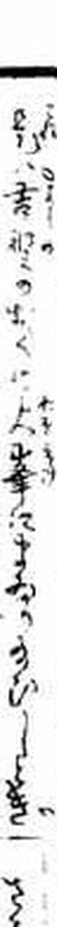是は吉野のおくに大峯にまゐり給ひしとき
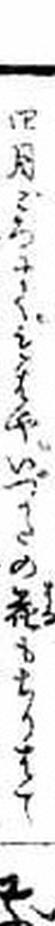四月ごろにてもはやいづかたの花ももちりはて前大
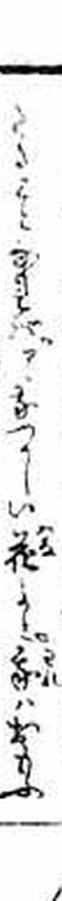たることなればなつかしい花よと我にはおもふ僧
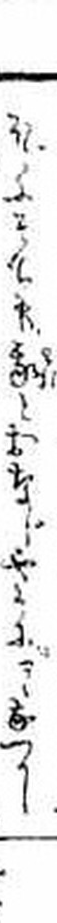ほどにそちも我とおなじやうにはなつかし
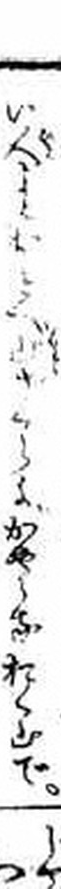い人よとおとへ山ざくらよかやうなおく山で
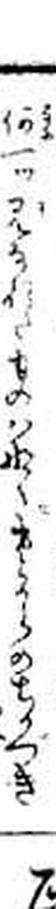何一つ見なれたものはなくとからのちかづきの上
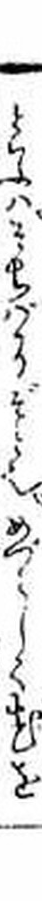といふはそちばかりぞと也めづらしく花を行
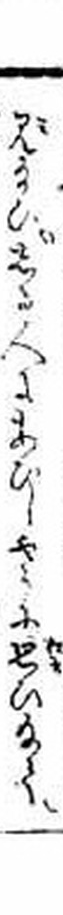見給ひしる人にあひしやうに思ひ給て尊
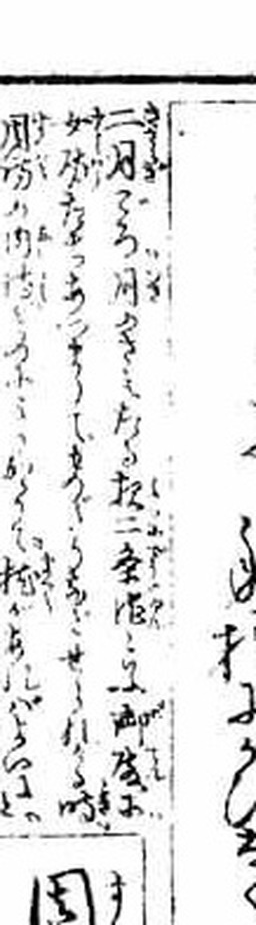二月ごろ月のさえたる夜二条院といふ御殿に
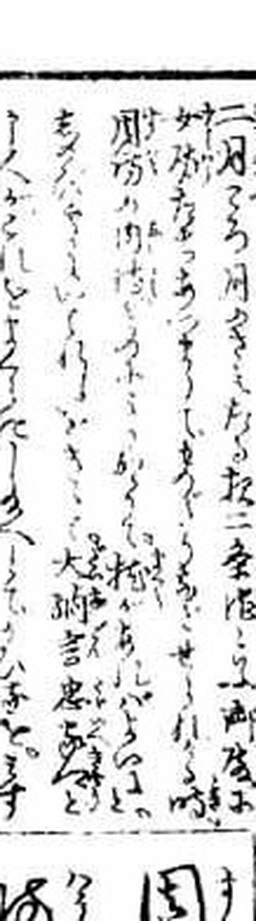周防の内侍のによかゝりて手枕があればよいにと
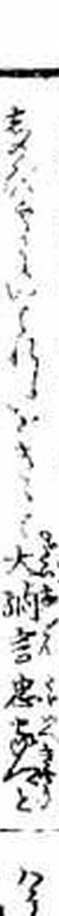しのびやうにいはれしをきゝて大納言忠家卿と防
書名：小倉百人一首
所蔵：東京学芸大学教育コンテンツアーカイブ
